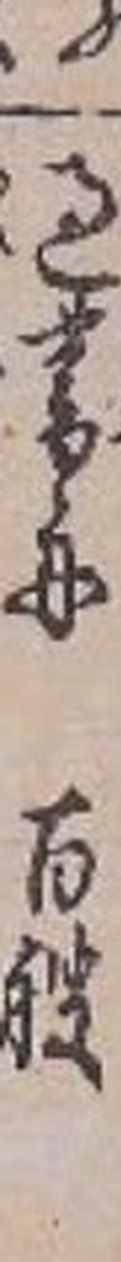過書舟百艘
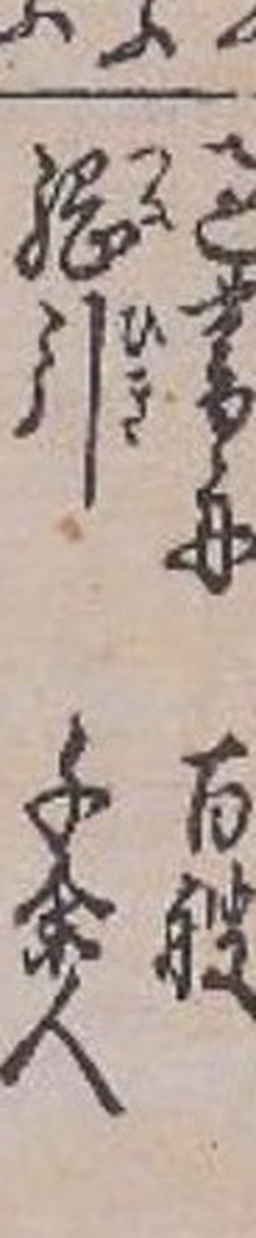綱引千余人
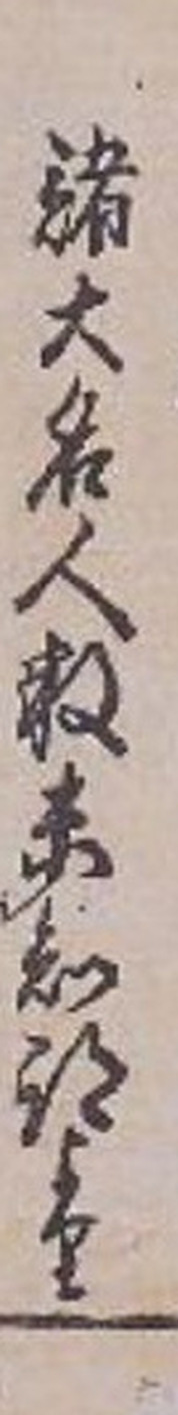諸大名人数未知跡より
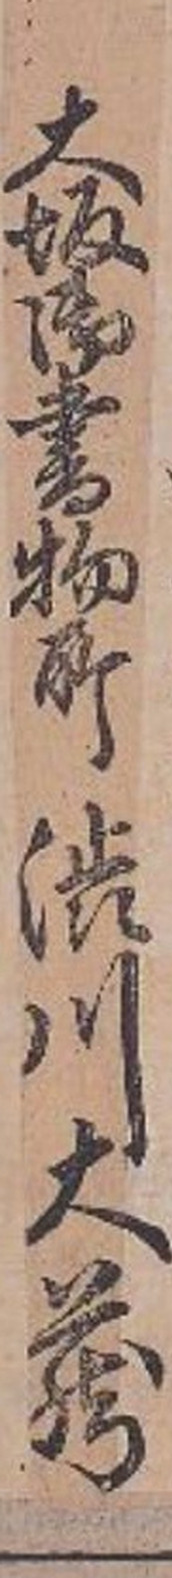大坂御書物所渋川大蔵
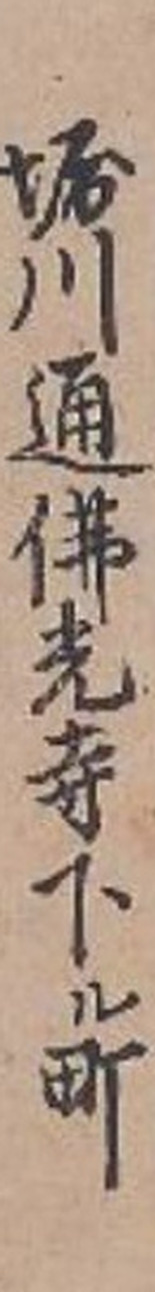堀川通佛光寺下る町
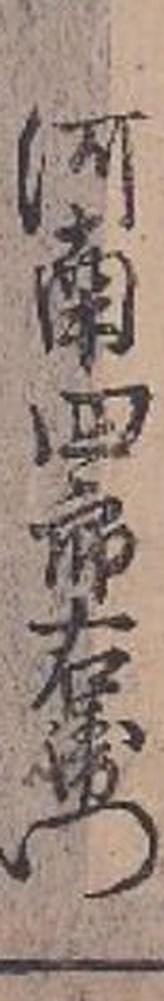河南四郎右衛門
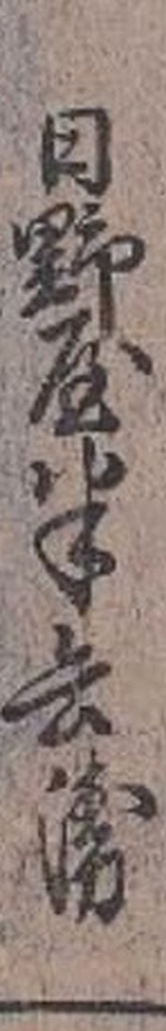日野屋半兵衛
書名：琉球人大行列記 大全 来朝新板絵入
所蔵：University of the Ryukyus Library
